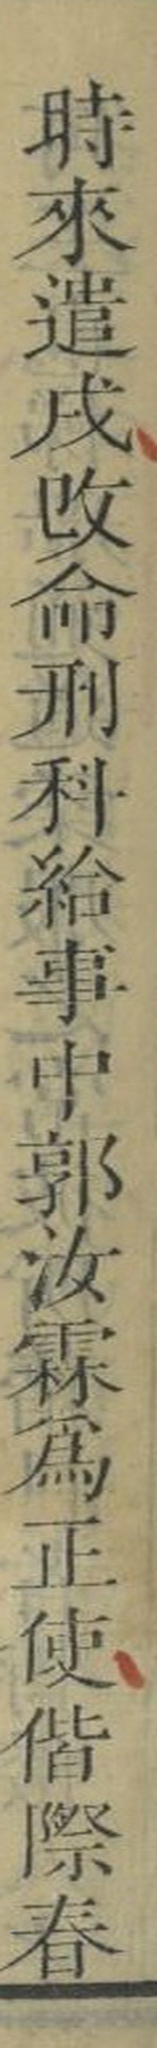時来遣戌改命刑科給事中郭汝霖為正使偕際春
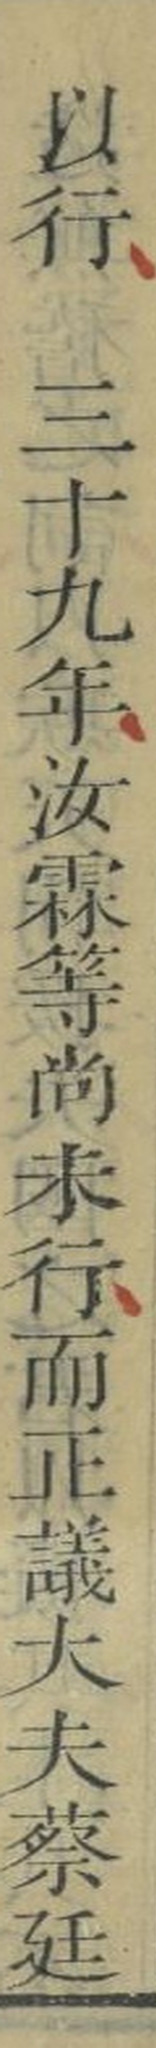以行三十九年汝霖等尚未行而正議大夫蔡廷
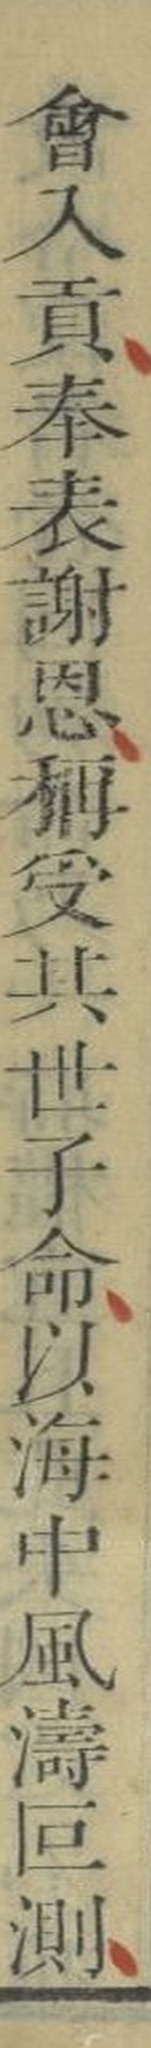会入貢奉表謝恩称受其世子命以海中風濤叵測
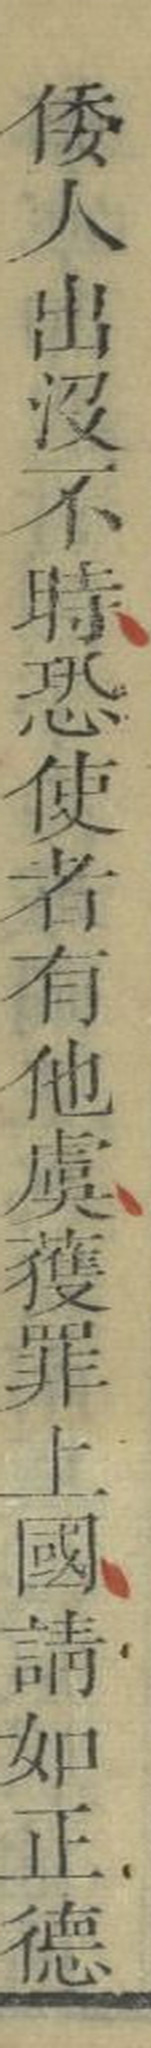倭人出没不時恐使者有他虞獲罪上国請如正徳
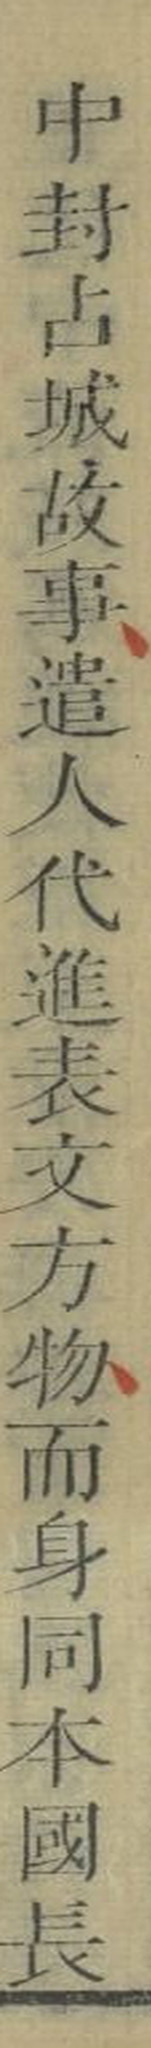中封占城故事遣人代進表文方物而身同本国長
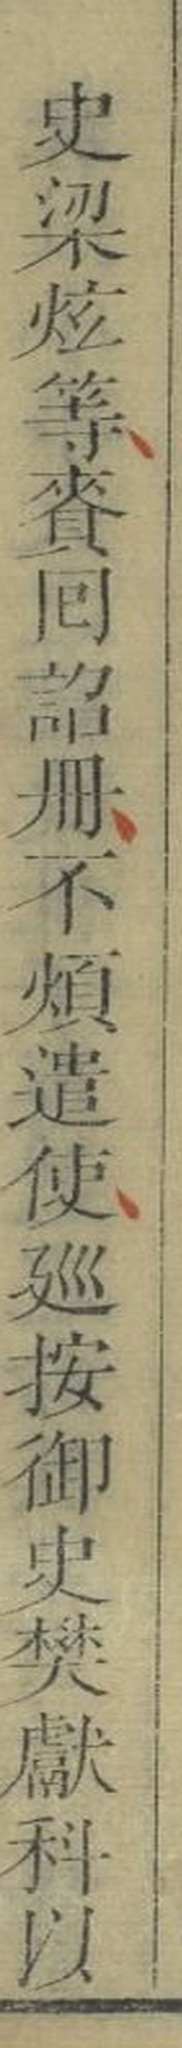史梁炫等賚回詔冊不煩遣使巡按御史焚献科以
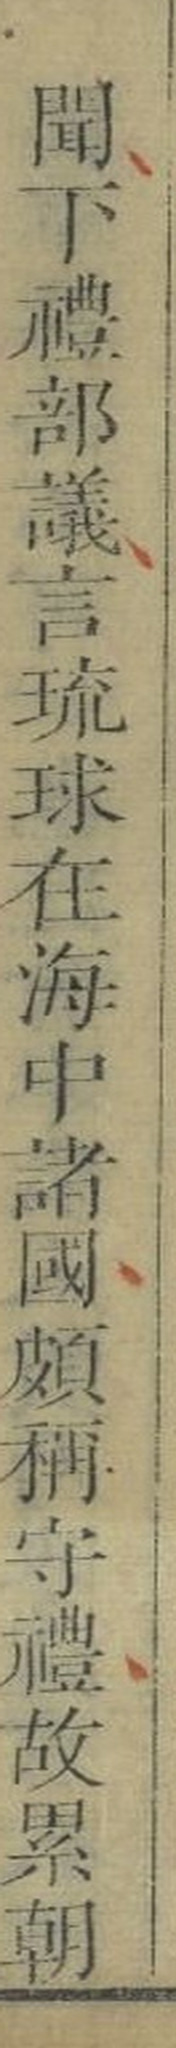聞下礼部議言琉球在海中諸国頗称守礼故累朝
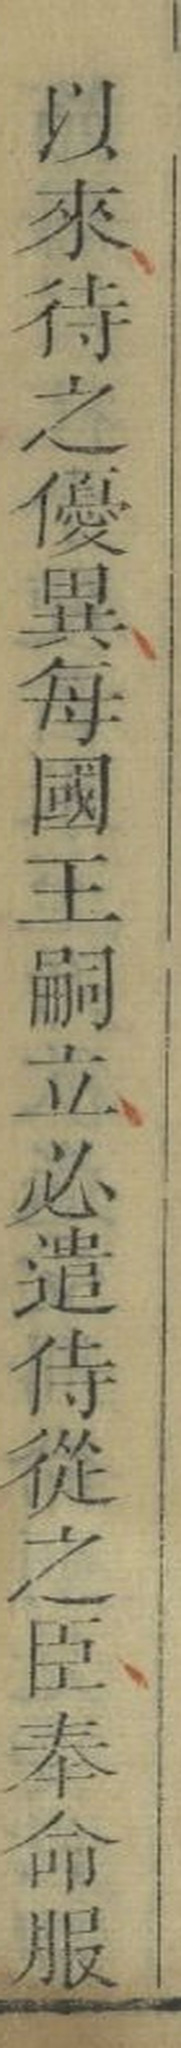以来待之優異毎国王嗣立必遣侍従之臣奉命服

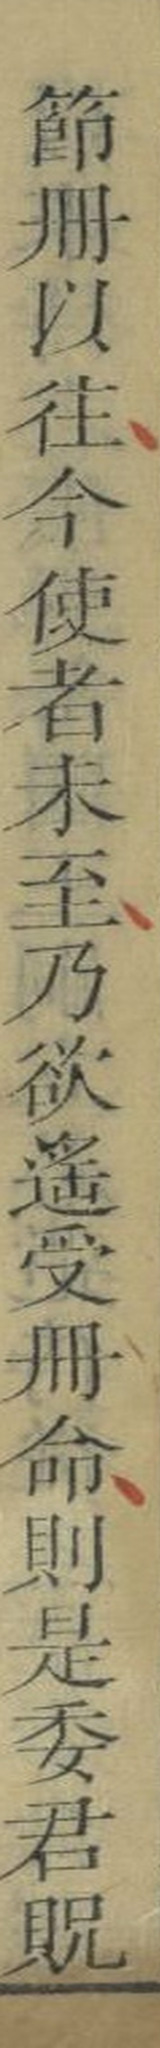節冊以往今使者未至乃欲遥受冊命則是委君貺
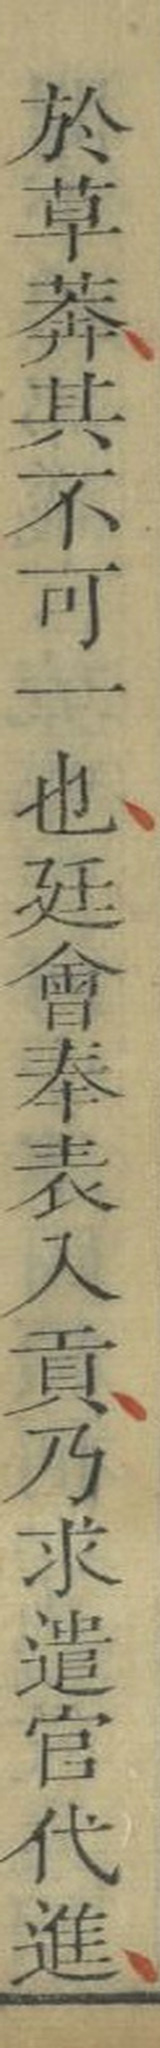於草莽其不可一也廷会奉表入貢乃求遣官代進
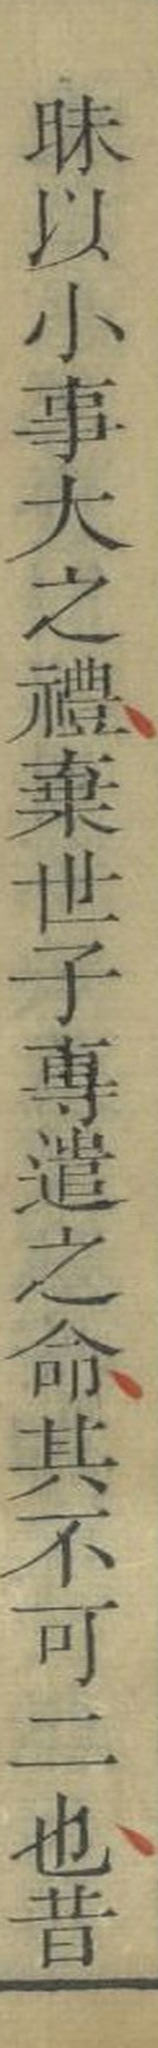昧以小事大之礼棄世子専遣之命其不可二也昔
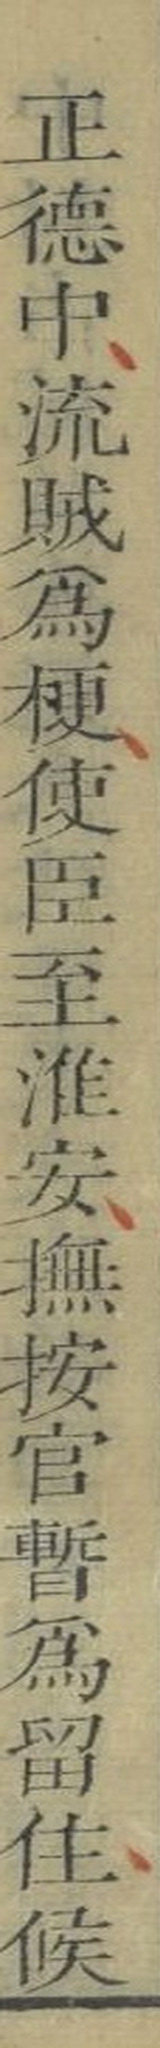正徳中流賊為梗使臣至淮安撫按官暫為留住候
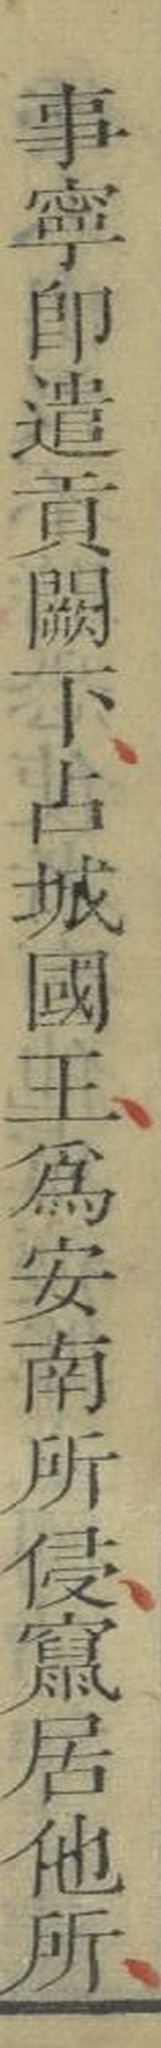事寧即遣貢闕下占城国王為安南所侵竄居他所
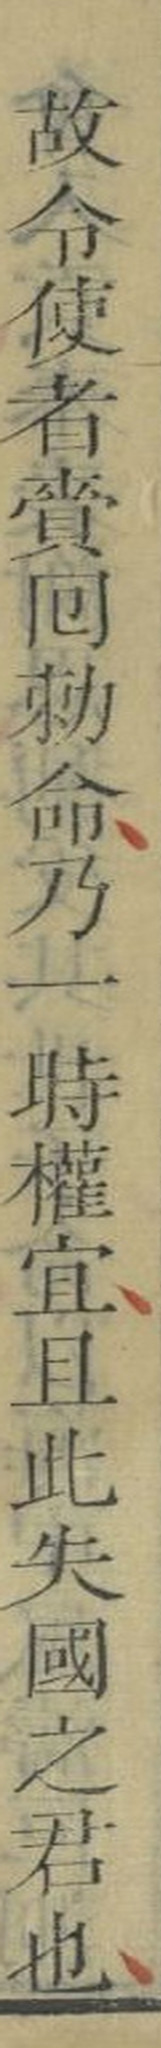故令使者賚回勅命乃一時権宜且此失国之君也
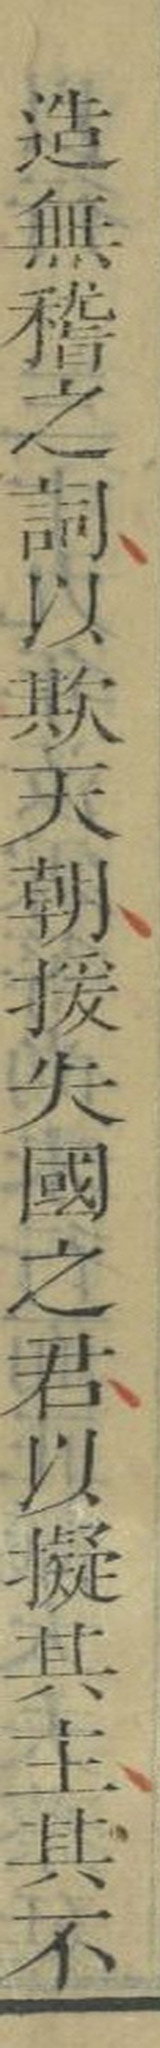造無稽之詞以欺天朝援失国之君以擬其主其不
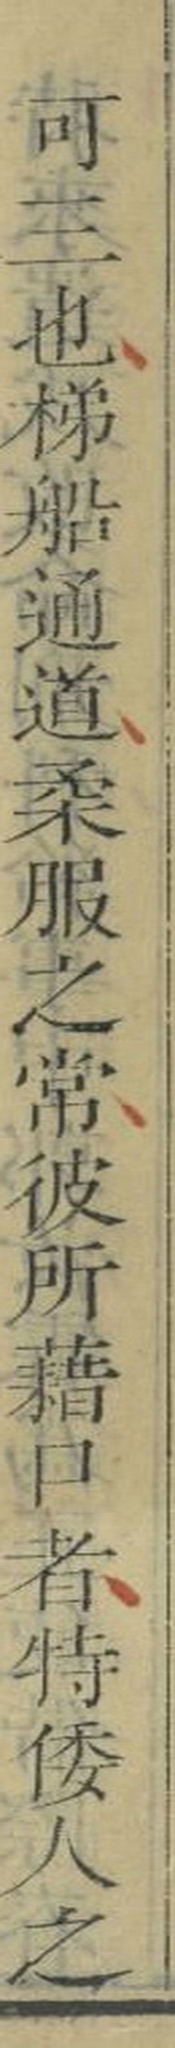可三也梯船通道柔服之常彼所藉口者特倭人之
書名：中山伝信録 巻三
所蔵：University of the Ryukyus Library
